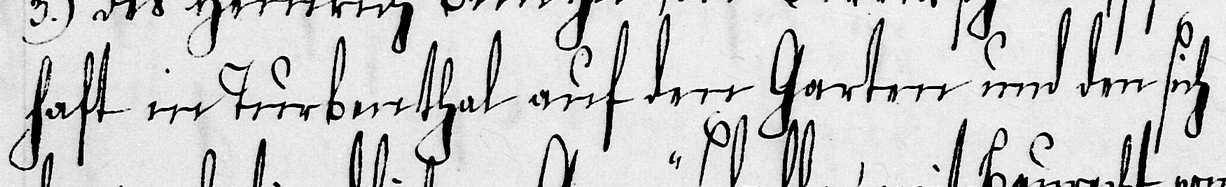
haft in Turbenthal auf den Garten und den si¬
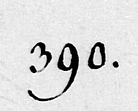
390.
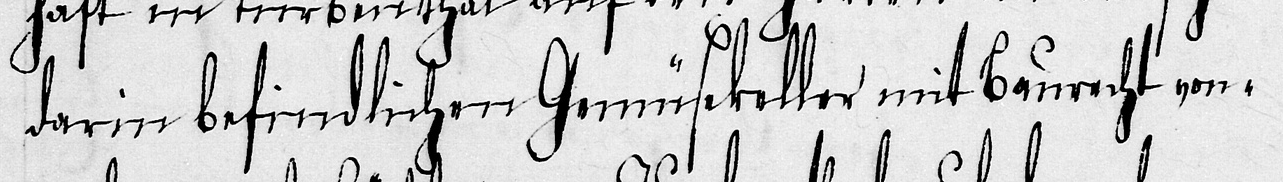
darin befindlichen Gemüsekeller mit Baurecht von
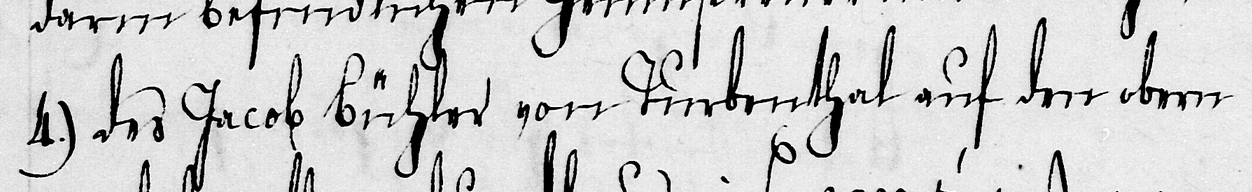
4.) des Jacob Bühler von Turbenthal auf den obern
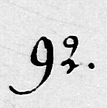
92.
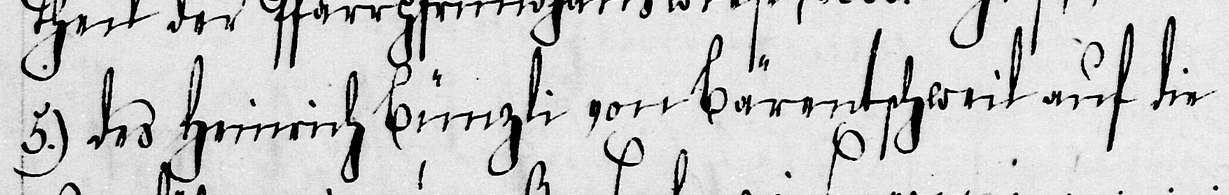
5.) des Heinrich Bünzli von Bärentschweil auf die
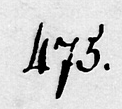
475.
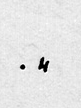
40.
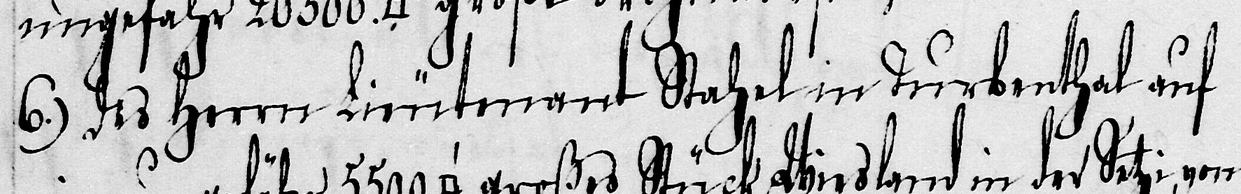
6.) des Herrn Lieutenant Stahel in Turbenthal auf
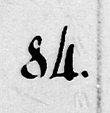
84.
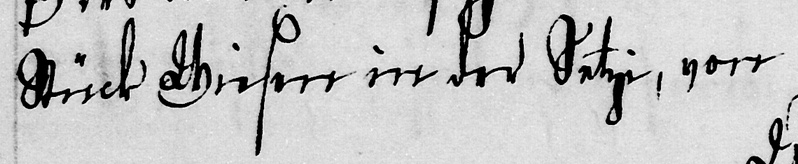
Stück Wiesen in der Setzi, von
